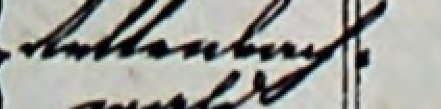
Dettenbach„
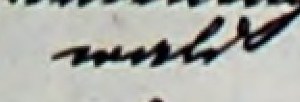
wald
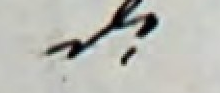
do
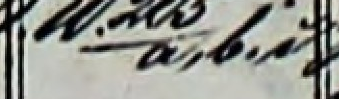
P.W. 205/a, b, i
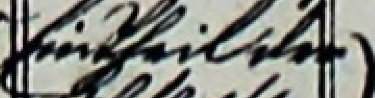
Ein Theil der
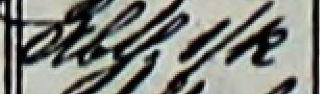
Abth. 1/k
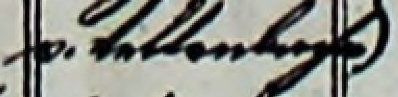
v. Dettenbache
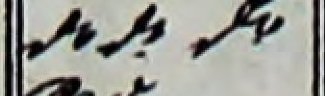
do do do
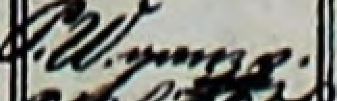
P.W. ganz v.
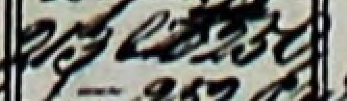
213 bis 250,
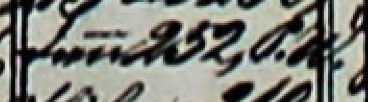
dann 252, P.W.
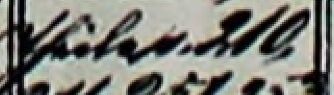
Theile v. 210,
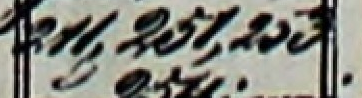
211, 251, 253
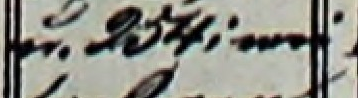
u. 254; ???
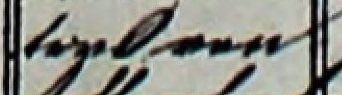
te???s von
